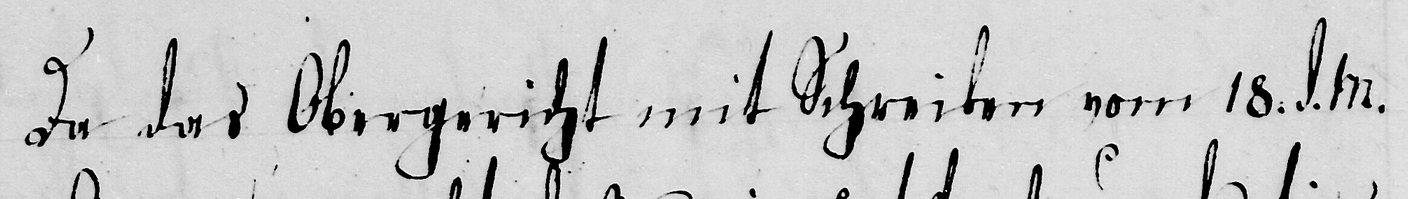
Da das Obergericht mit Schreiben vom 18. d. M.
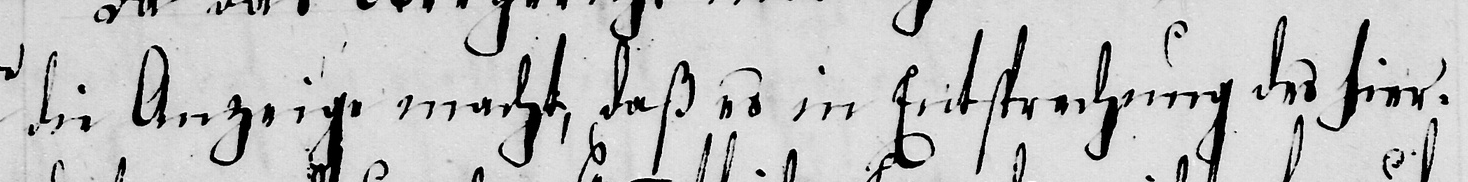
die Anzeige macht, daß es in Entsprechung des hier¬
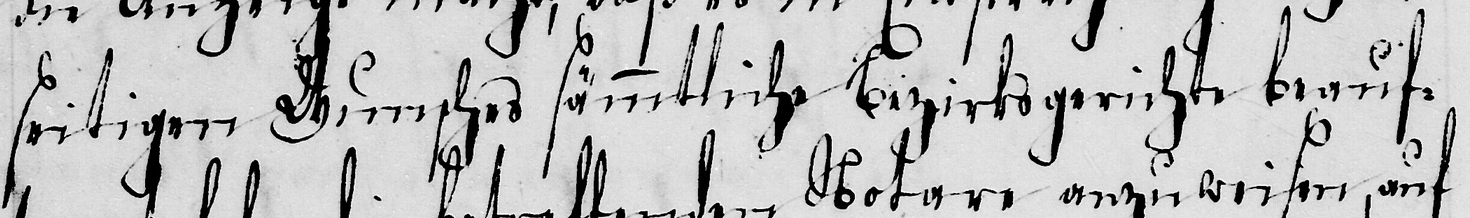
seitigen Wunsches sämmtliche Bezirksgerichte beauf¬
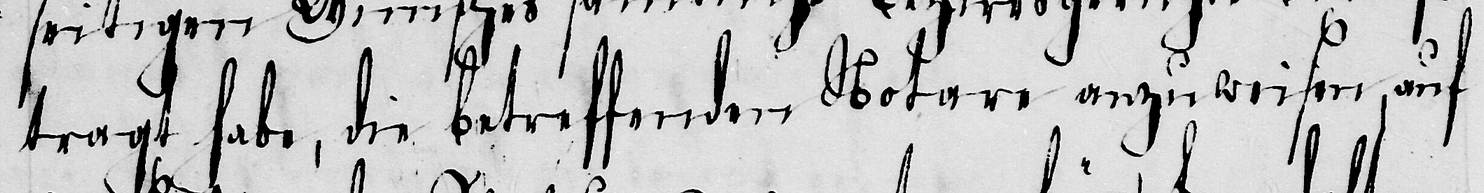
tragt habe, die betreffenden Notare anzuweisen, auf
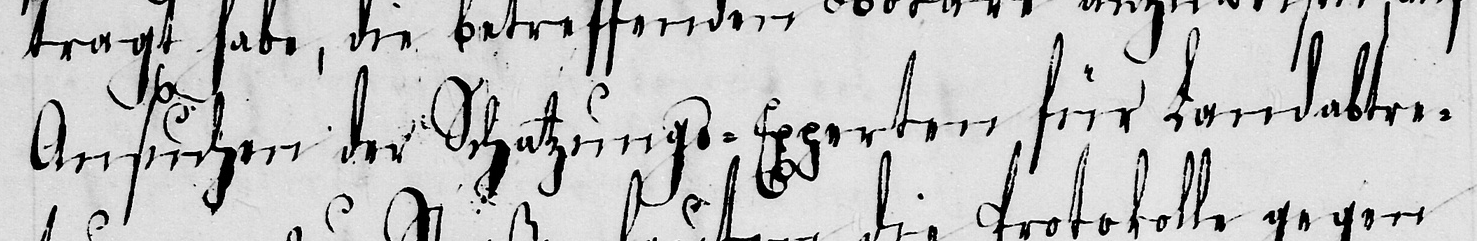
Ansuchen der Schatzungs-Experten für Landabtre¬
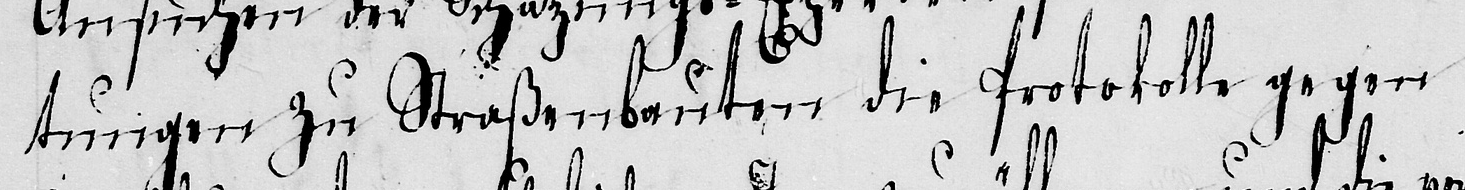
tungen zu Straßenbauten die Protokolle gegen
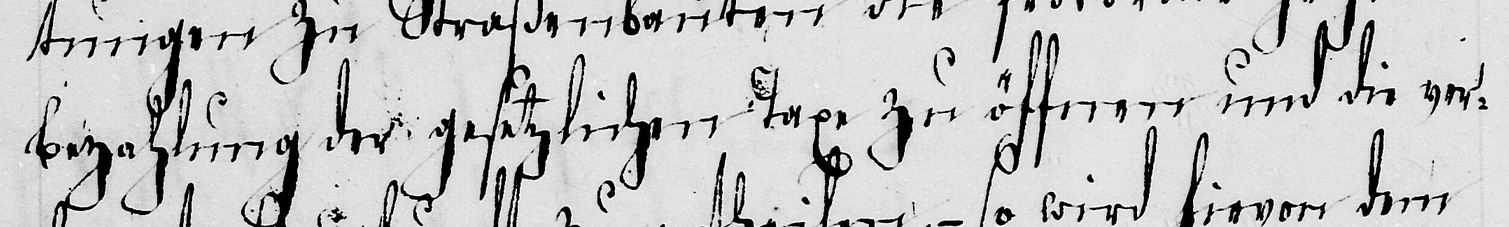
Bezahlung der gesetzlichen Taxe zu öffnen und die ve¬
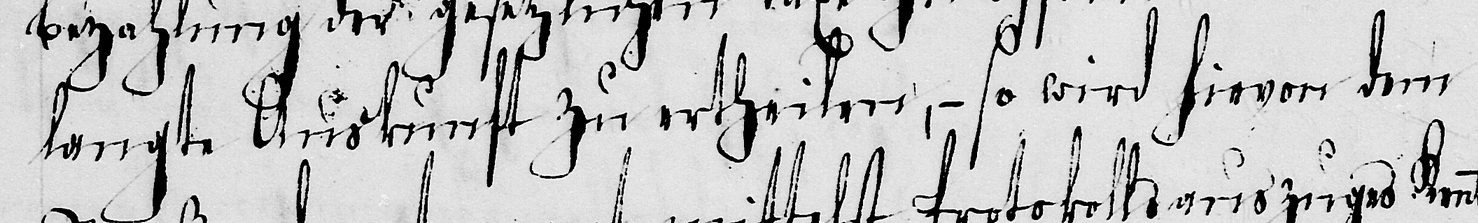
rlangte Auskunft zu ertheilen, – so wird hievon dem
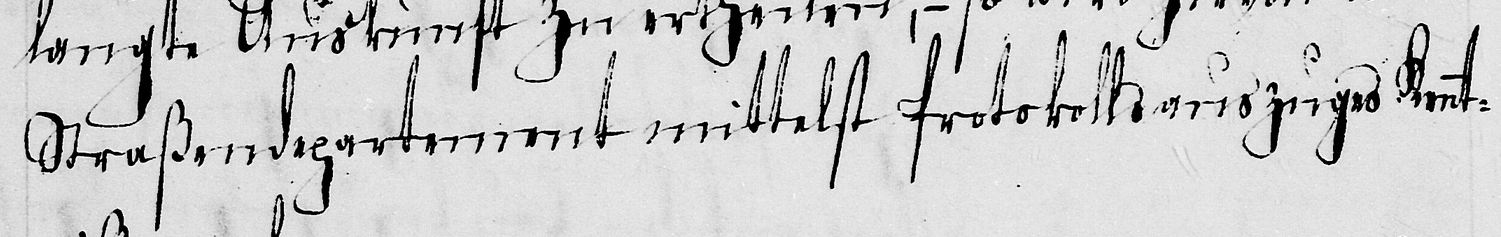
Straßendepartement mittelst Protokollsauszuges Ken¬
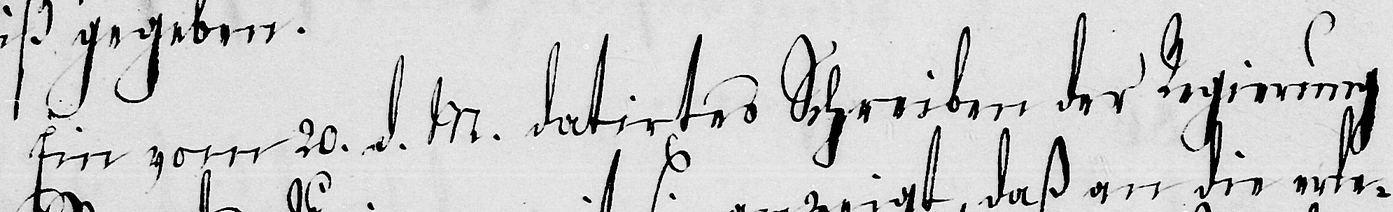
Ein vom 20. d. M. datirtes Schreiben der Regierung
